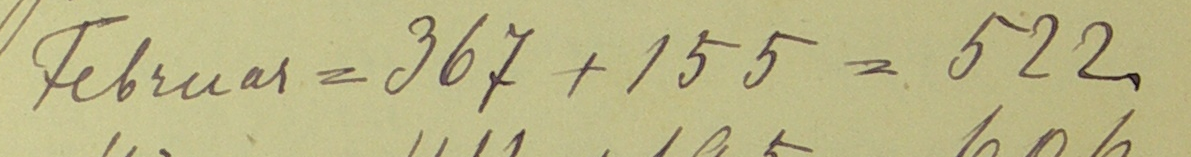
Februar = 367 + 155 = 522
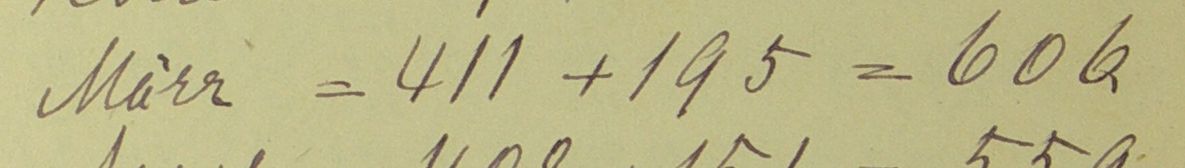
März = 411 + 195 = 606
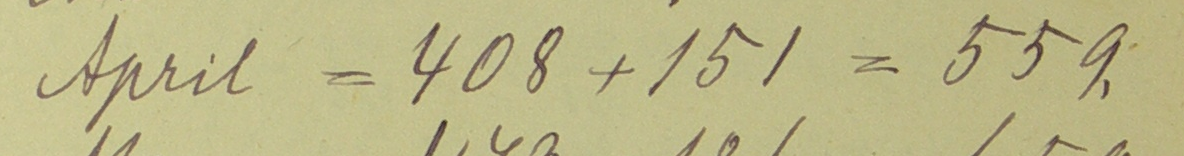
April = 408 + 151 = 559
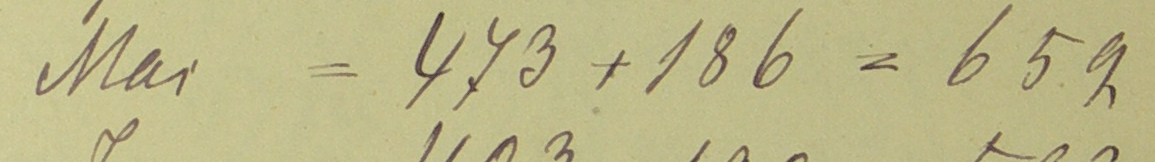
Mai = 473 + 186 = 659
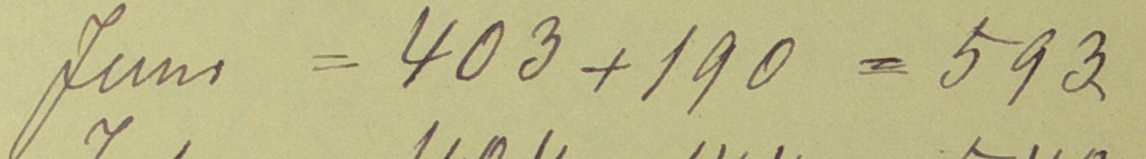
Juni = 403 + 190 = 593
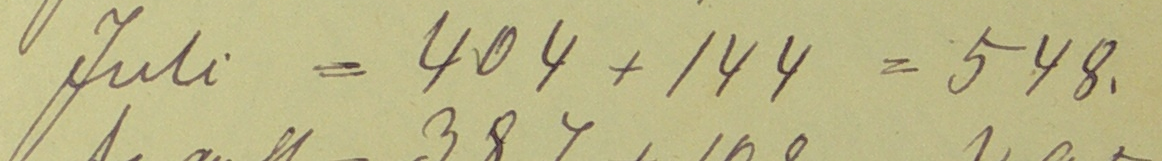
Juli = 404 + 144 = 548
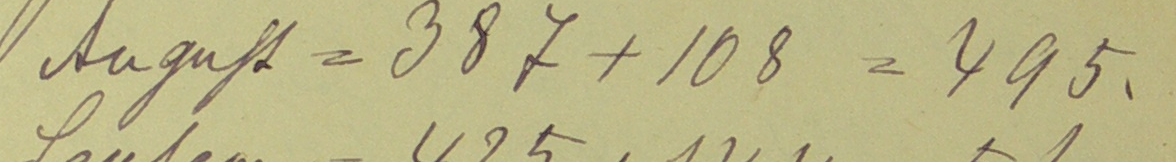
August = 387 + 108 = 495
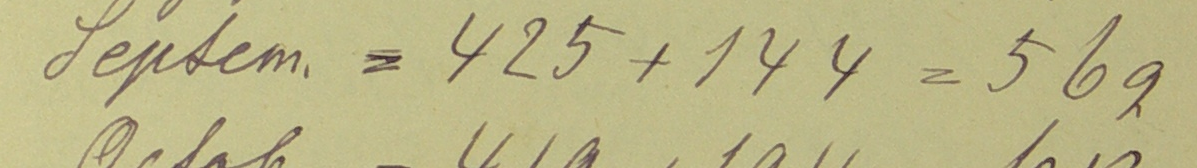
Septem. = 425 + 144 = 569
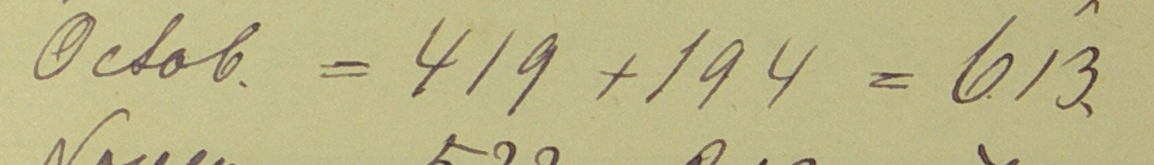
Octob. = 419 + 194 = 613
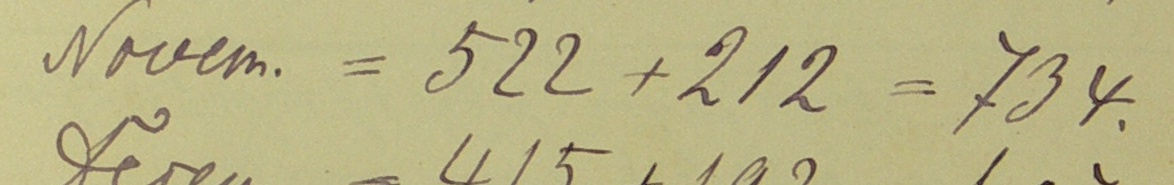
Novem. = 522 + 212 = 734
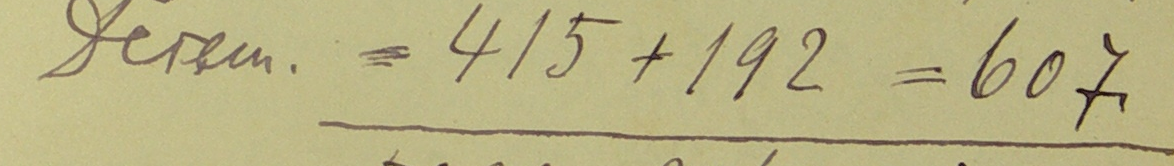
Decem. = 415 + 192 = 607
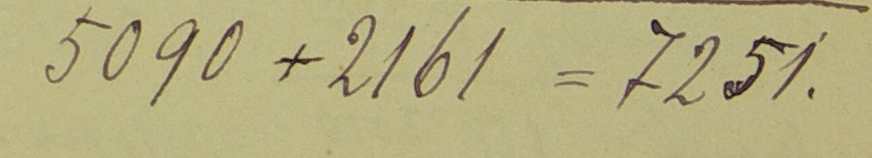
5090 + 2161 = 7251
